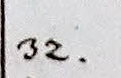32.
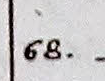68.
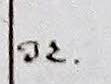32.
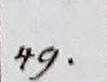49.
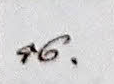46.
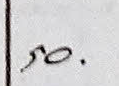50.
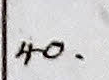40.
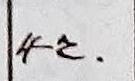42.
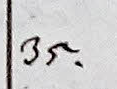35.
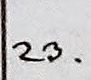23
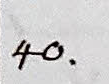40.
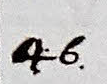46
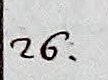26.
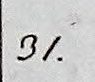31.
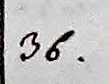36.
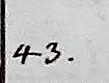43.
